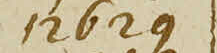12629
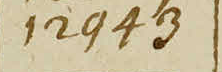12943
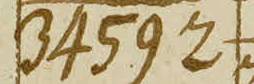34592
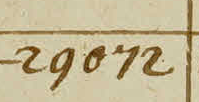29072
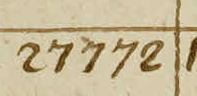27772
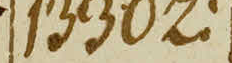13302
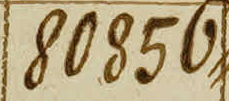80856
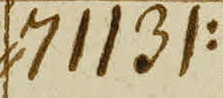71131
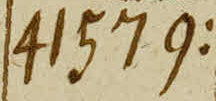41579
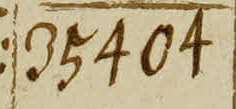35404
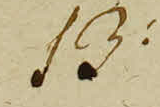13
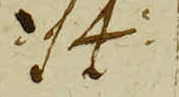14
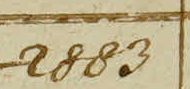2883
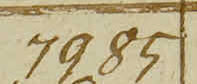7985
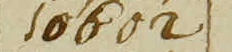10602
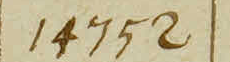14752
